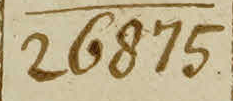26875
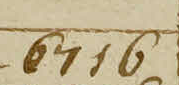6716
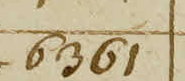6361
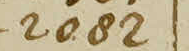2082
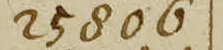25806
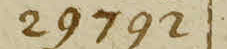29792
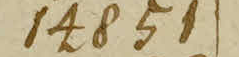14851
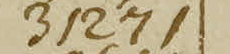31271
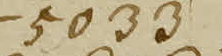5033
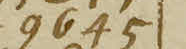9645
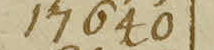17640
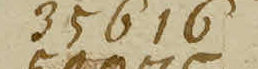35616
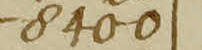8400
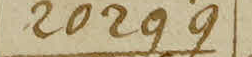20299
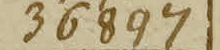36897
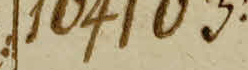164163
